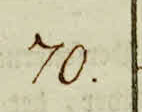70.
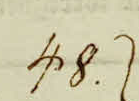48.
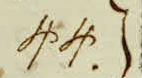44.
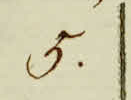5.
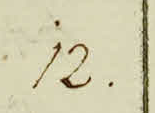12.
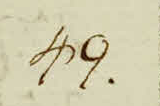49.
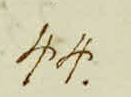44.
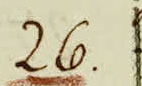26.
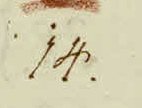14.
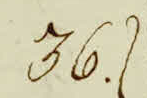36.
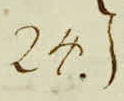24.
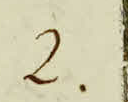2.
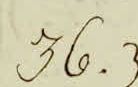36.
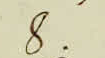8.
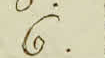6.
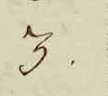3.
